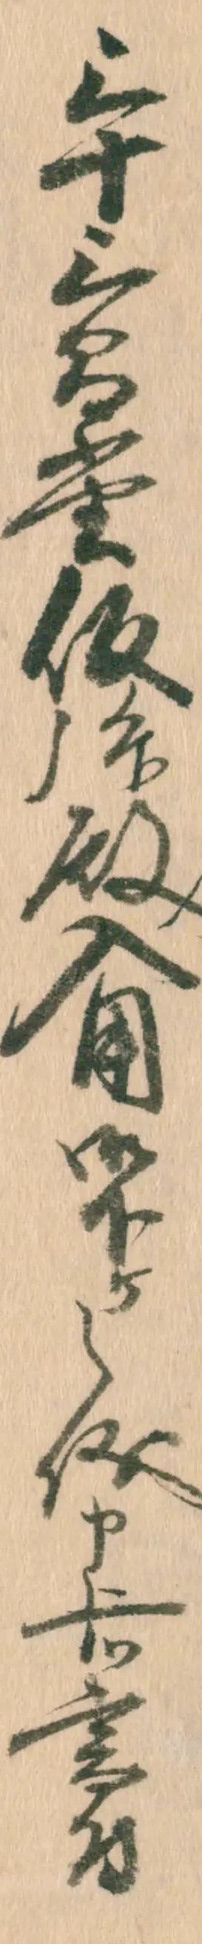│三十三間堂仮拝殿其外入用御下ケ之儀申上候書付
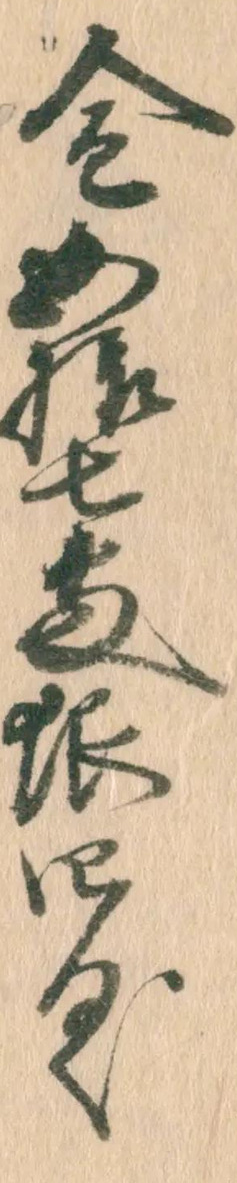一金五拾七両銀四匁
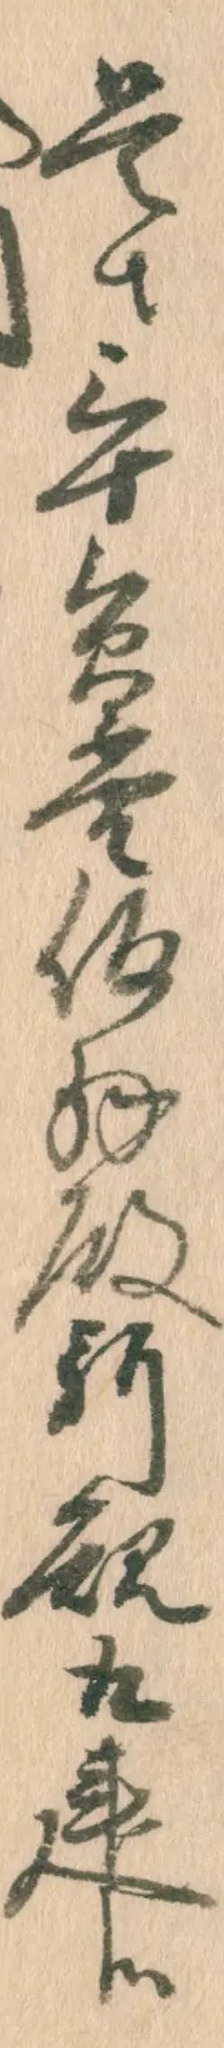是は三十三間堂仮拝殿新規取建候
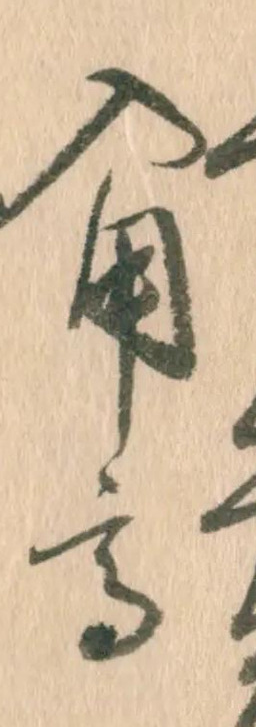入用高

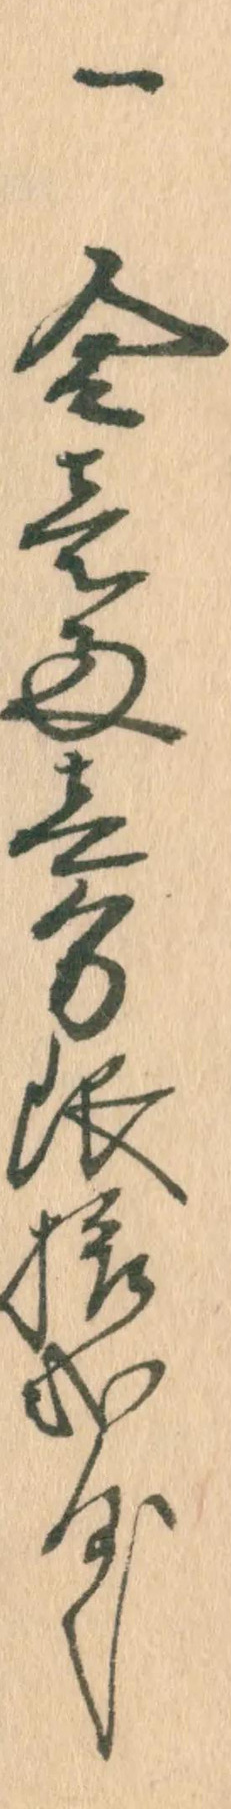一金壱両壱分銀拾弐匁
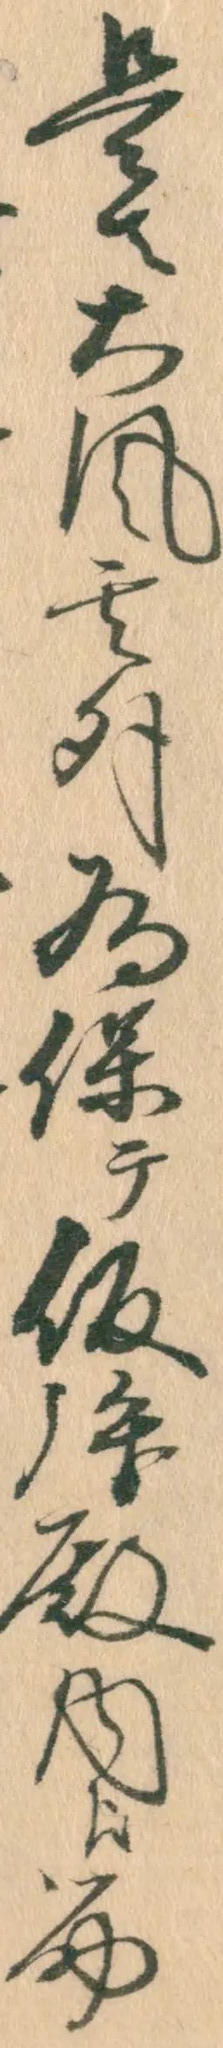是は大風其外為保テ仮拝殿内え筋
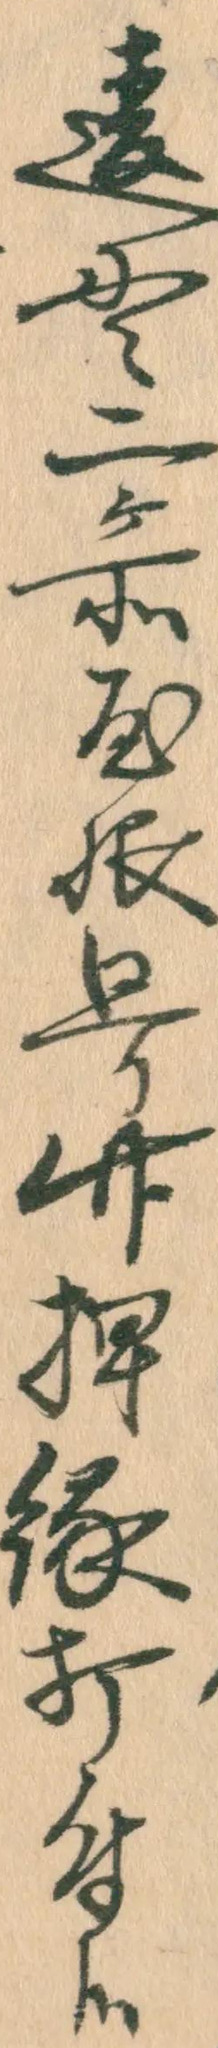違貫二ケ所屋根廻り竹押縁打付候
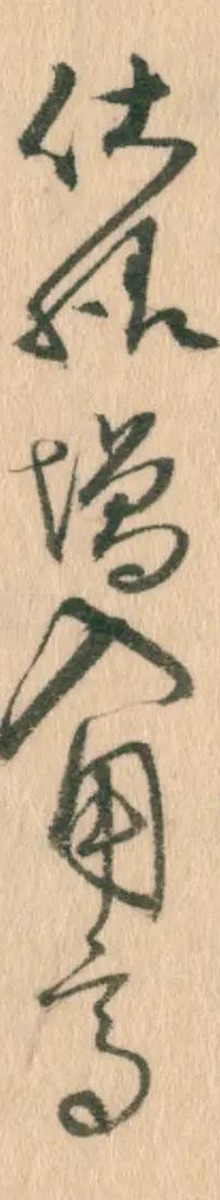仕様増入用高
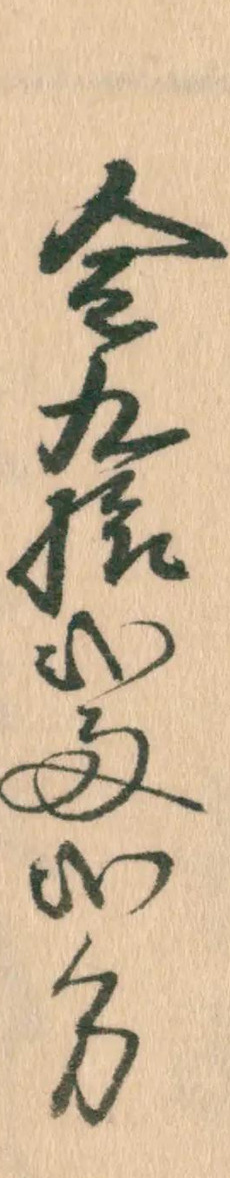一金九拾弐両弐分
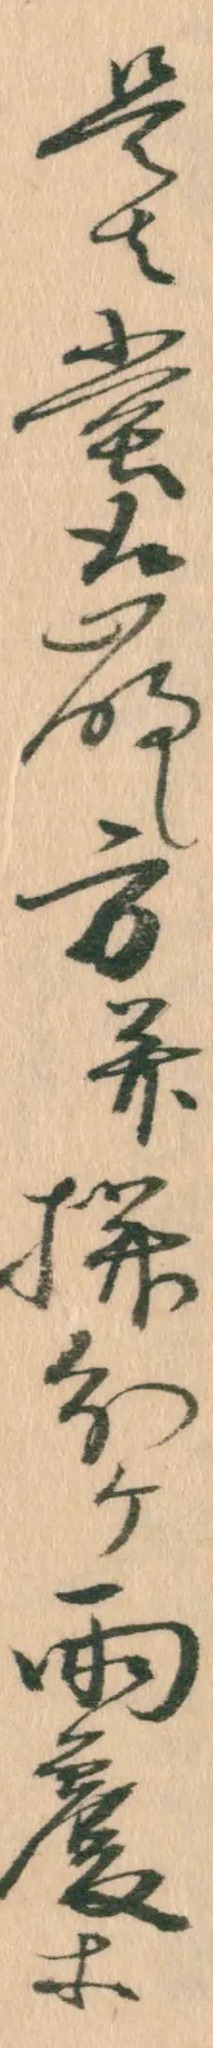是は堂取崩し方幷拼分ケ雨覆等
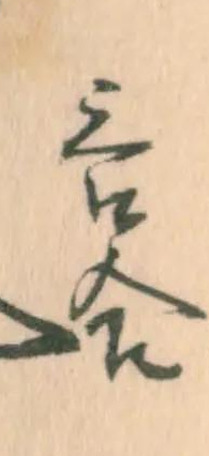三口合
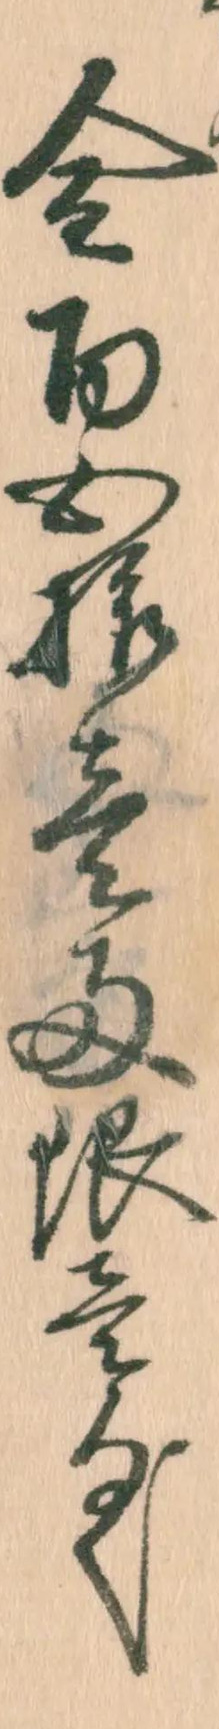金百五拾壱両銀壱匁
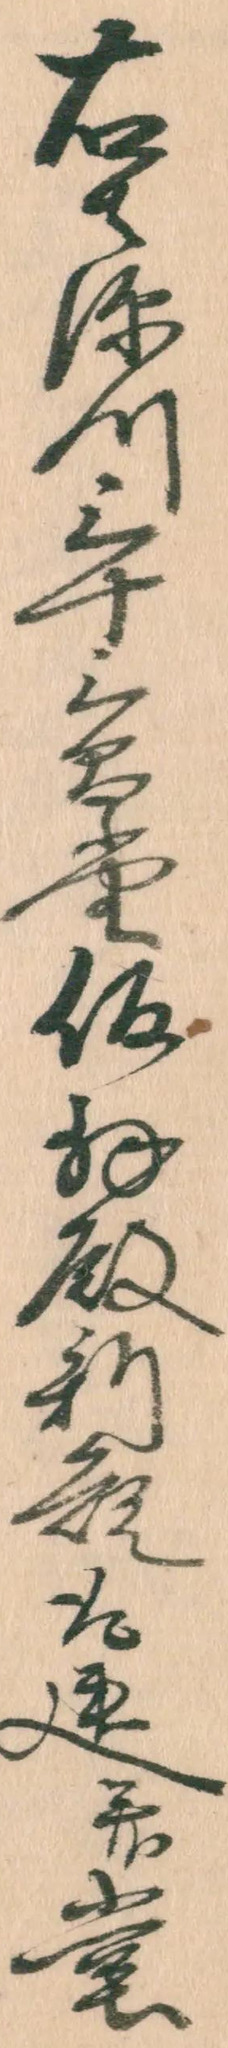右は深川三十三間堂仮拝殿新規取建幷堂
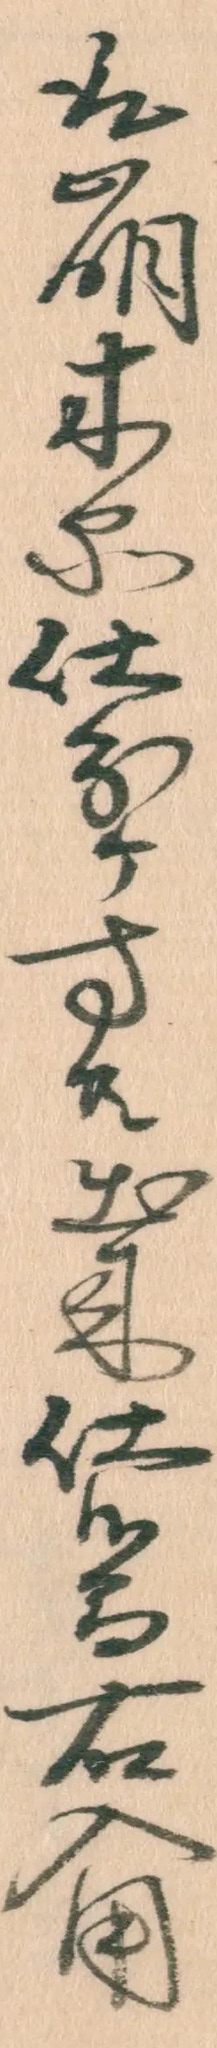取崩木品仕分ケ方共出来仕候間右入用
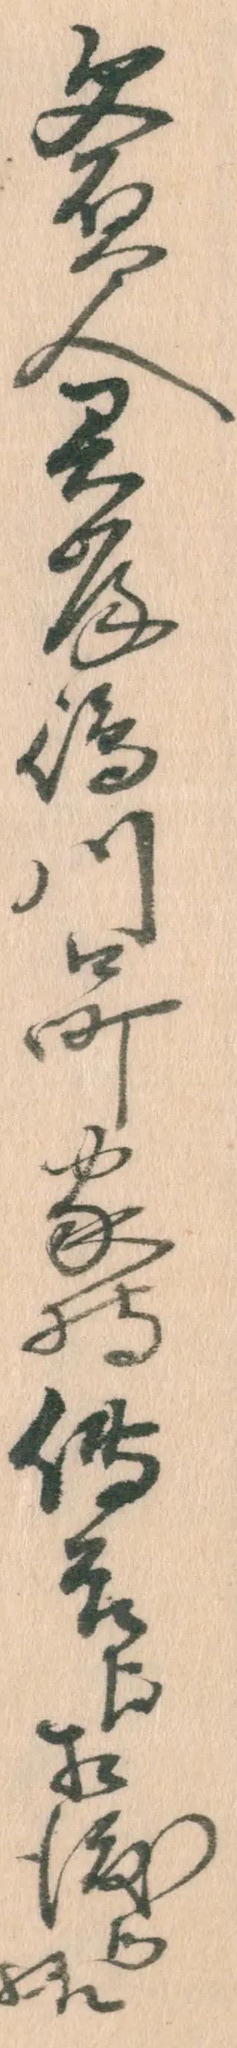請負人霊岸島川口町家持伝吉え相渡候様
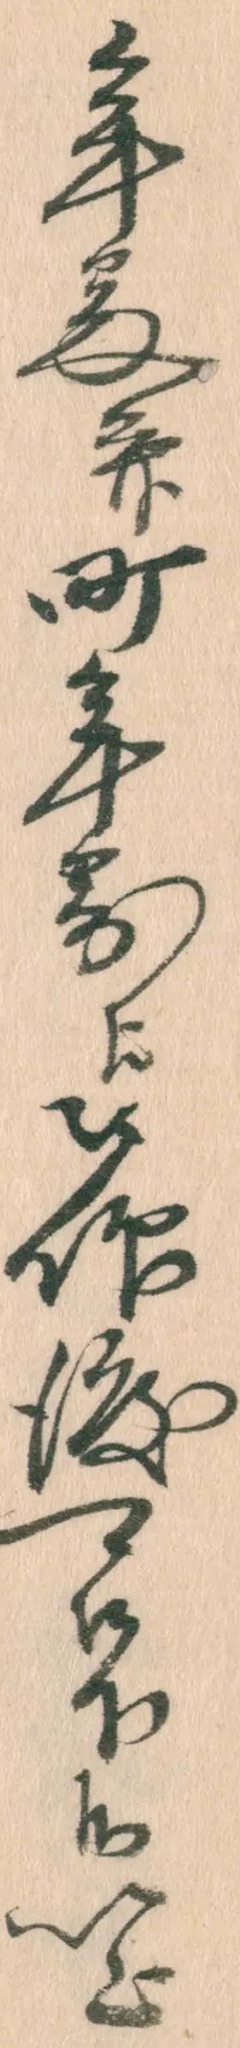年番幷町年寄え被仰渡可被下候以上
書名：三十三間堂. [2]
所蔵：国立国会図書館 National Diet Library, JAPAN
